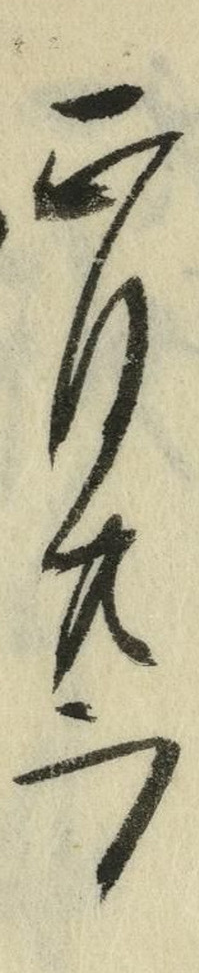正月廿二日
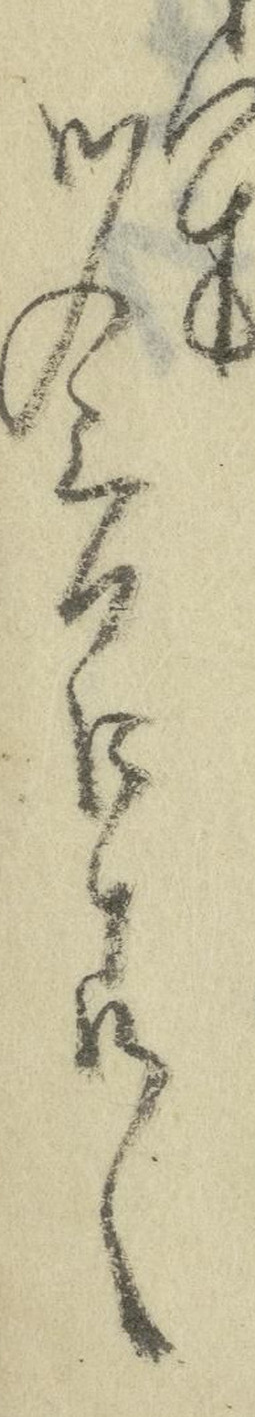弐貫三百四十四文

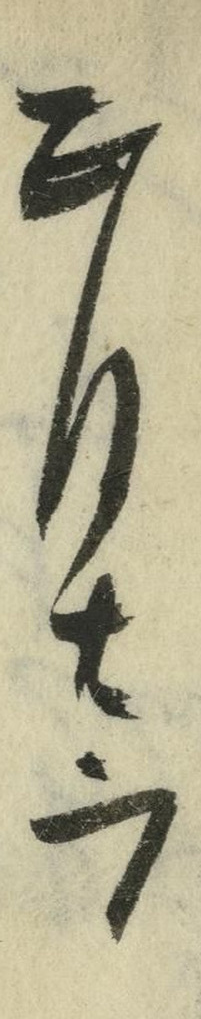正月廿二日
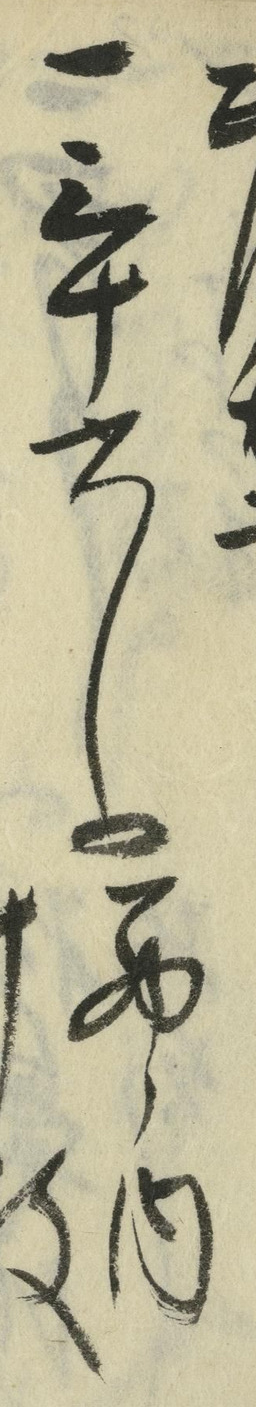一三十六文西之内
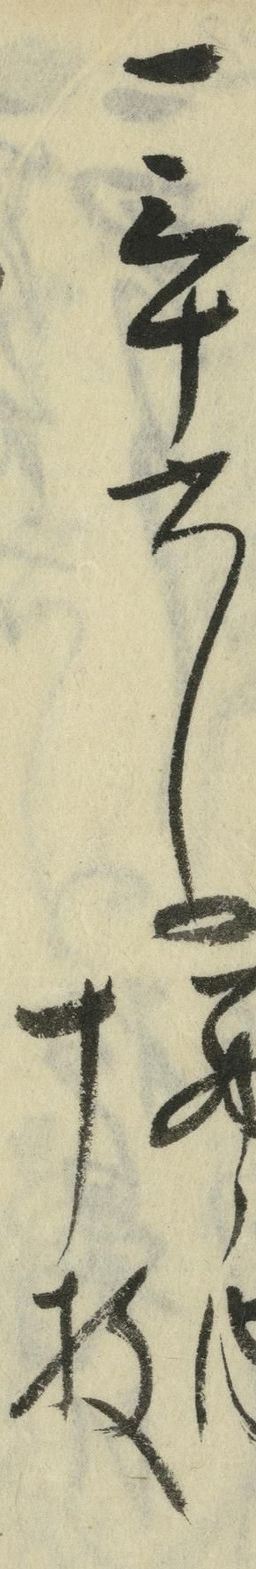一三十六文西之内
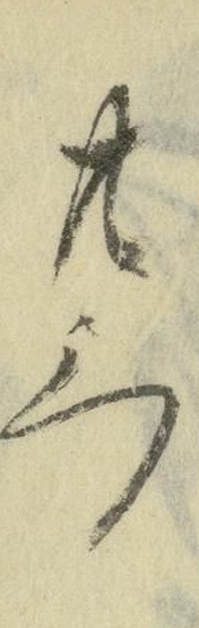廿三日
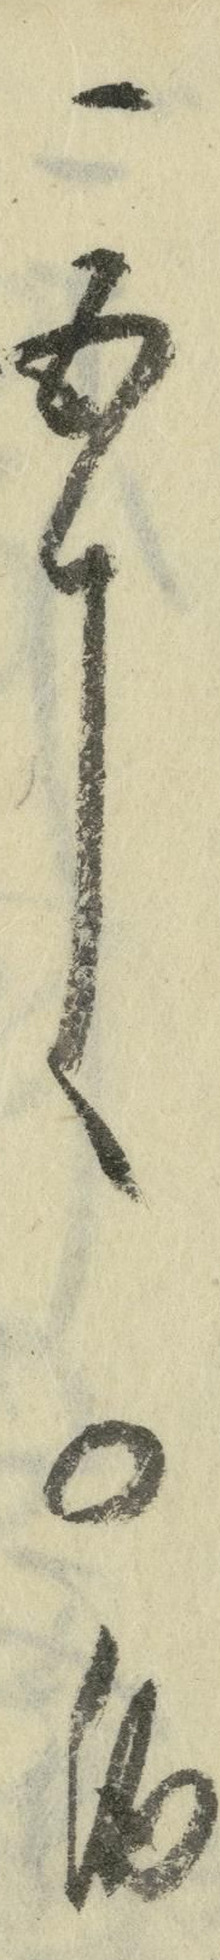一五十文酒
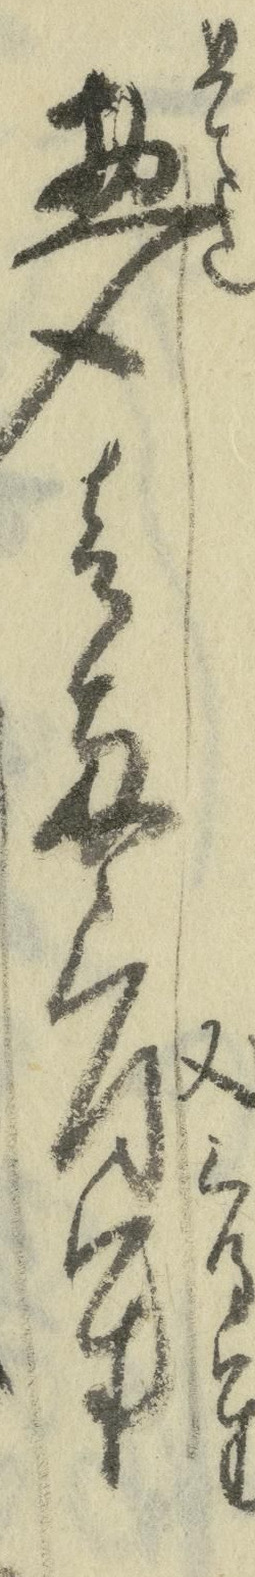惣〆壱両三分一朱
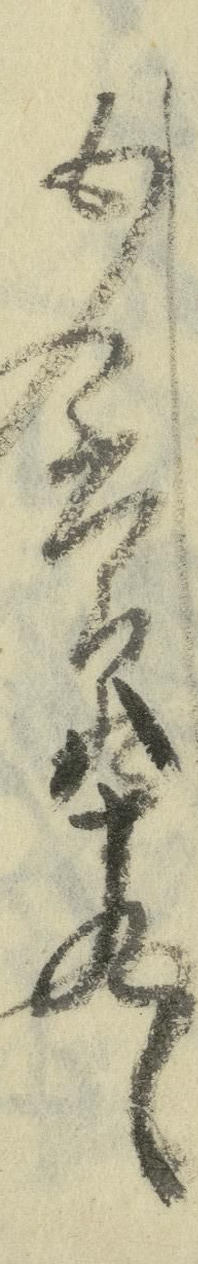五貫六百八十九文
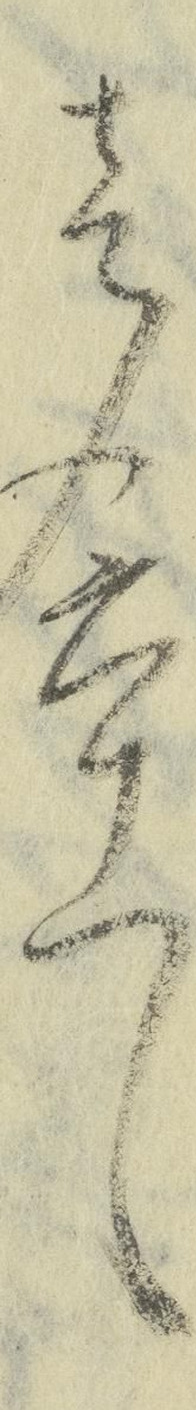壱貫六十一文
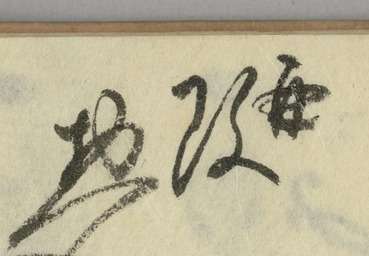廿三日
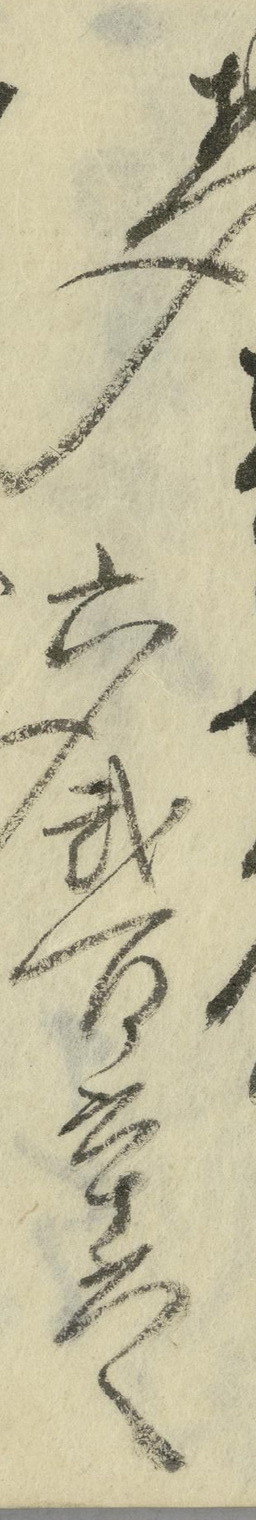六貫弐百六十六文
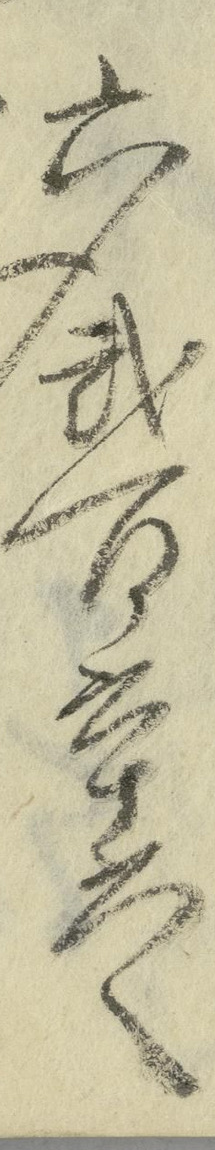六貫弐百六十六文
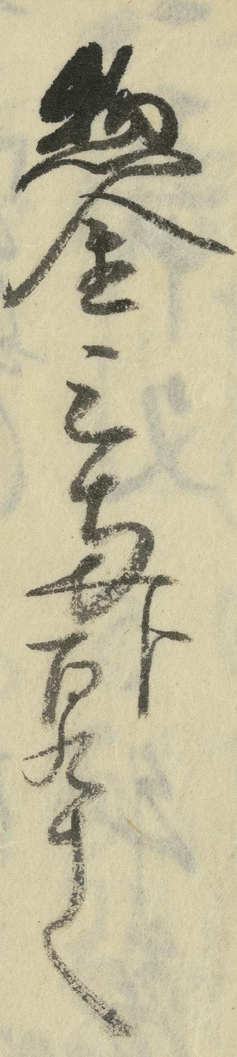惣金三両ト百九十文
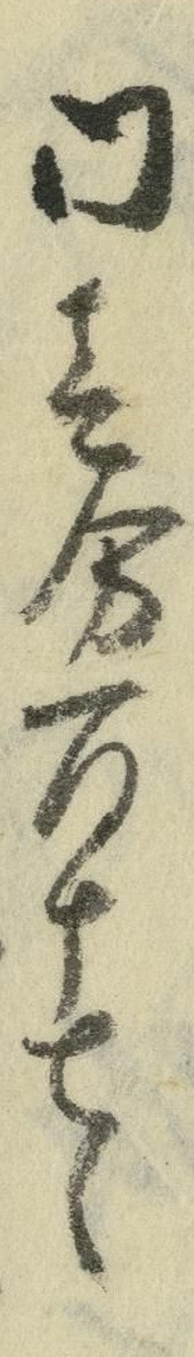内壱分百十七文
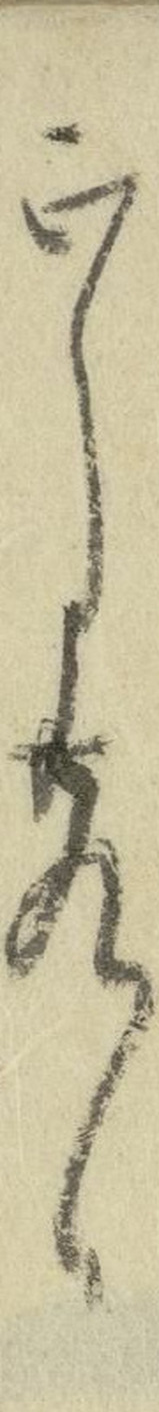正月廿二日
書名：天明淺間噴火ニ関スル書類
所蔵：東京大学地震研究所図書室 Earthquake Research Institute Library, The University of Tokyo, JAPAN
